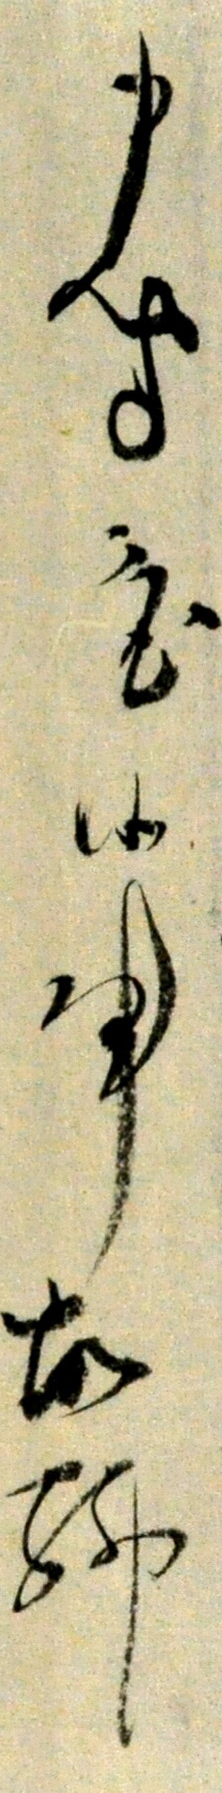申聞置候事故聊

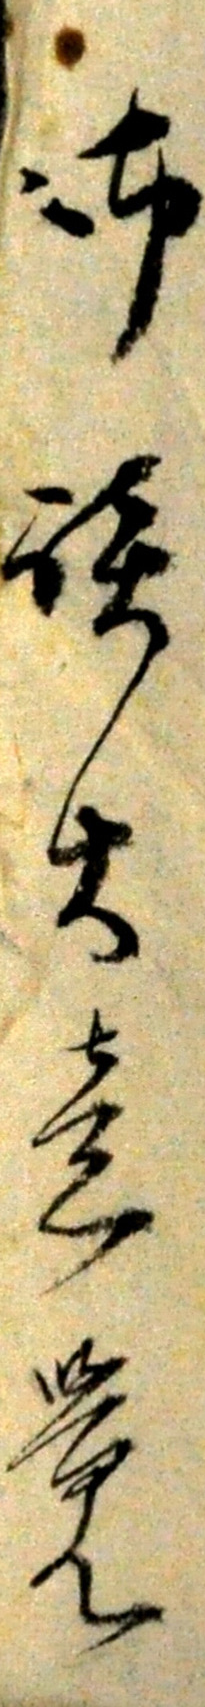御談大意覚

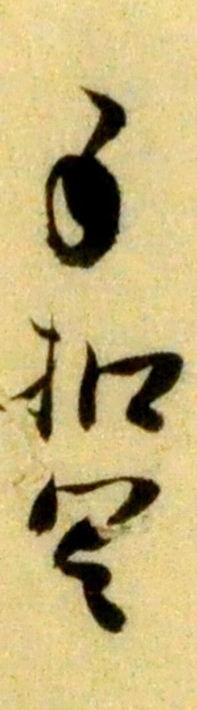手扣写

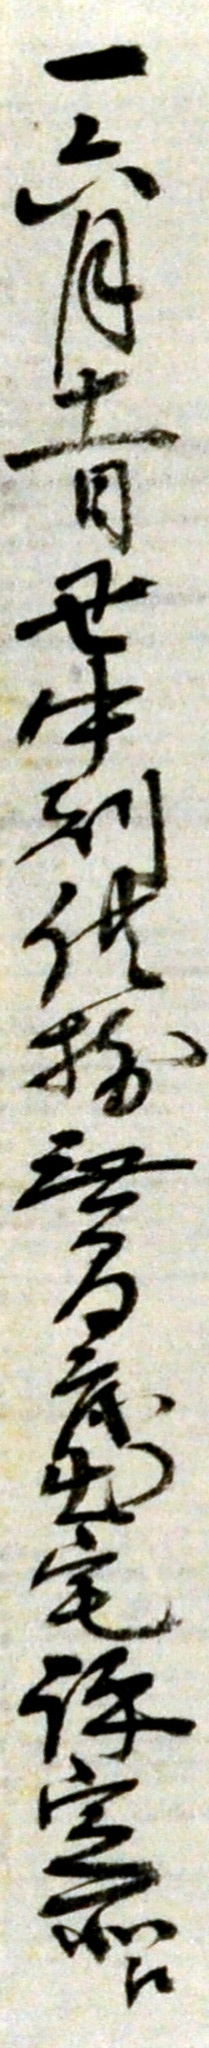一六月十一日丑中刻供揃無間茂出宅評定所江
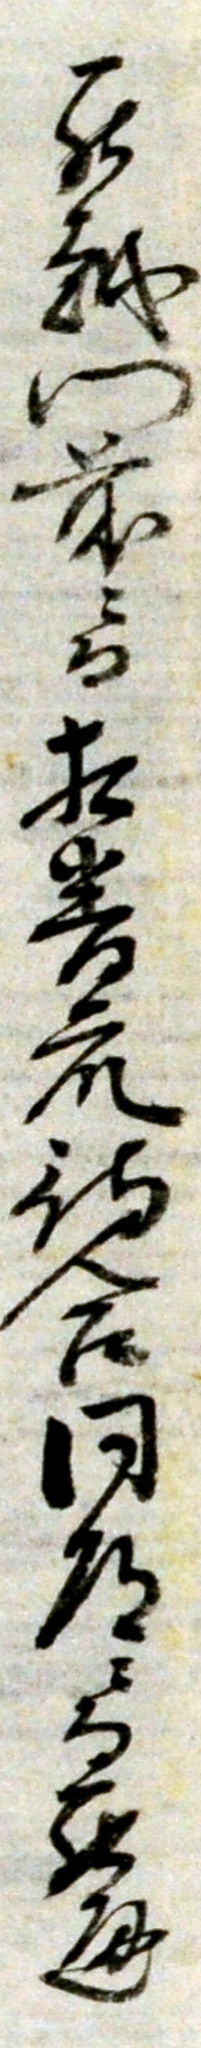罷越門前ニ而相番衆待合同道ニ而罷越
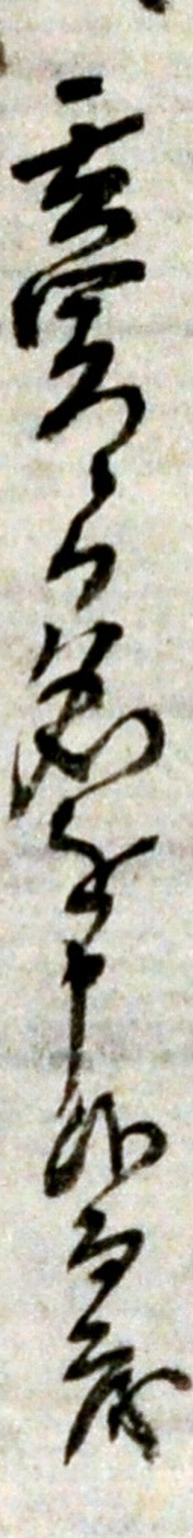玄関ニ名を申候而茂
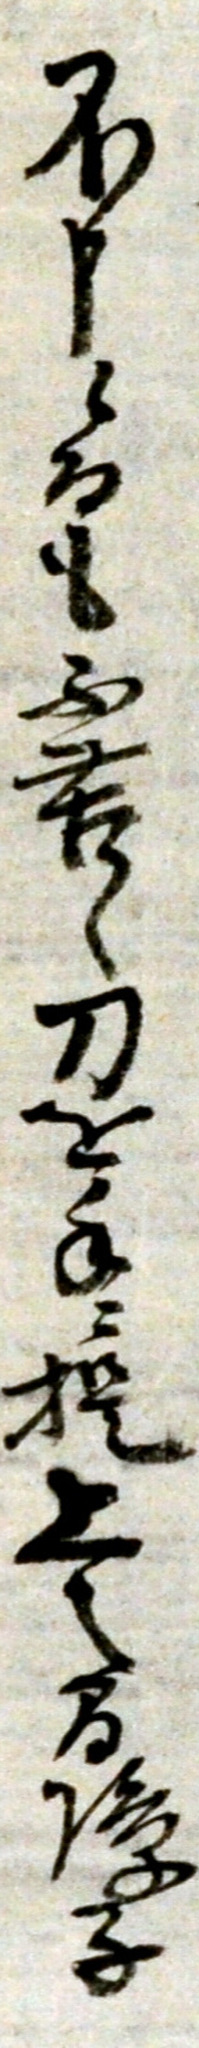不申ニ而茂不苦候刀を手ニ提上之間障子
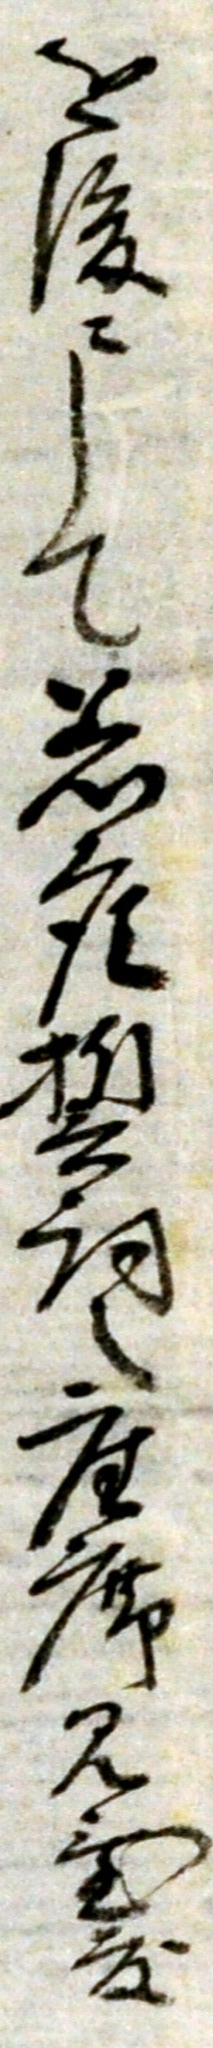を後ニして着座誓詞之座席見置度
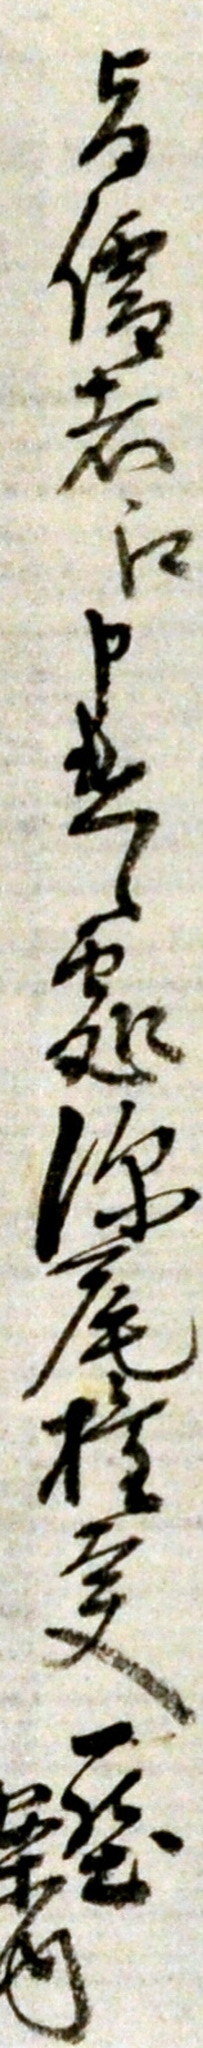旨儒者江申遣候處源尾桂太夫罷出案内
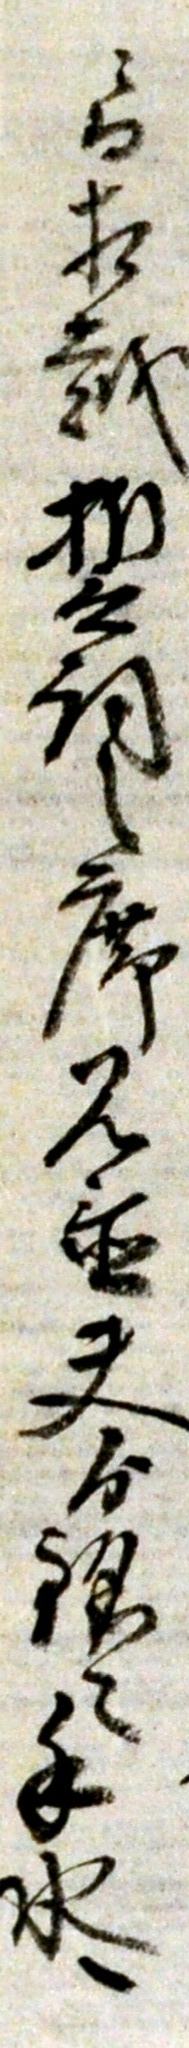ニ而相越誓詞之席見置夫ゟ銘々手水
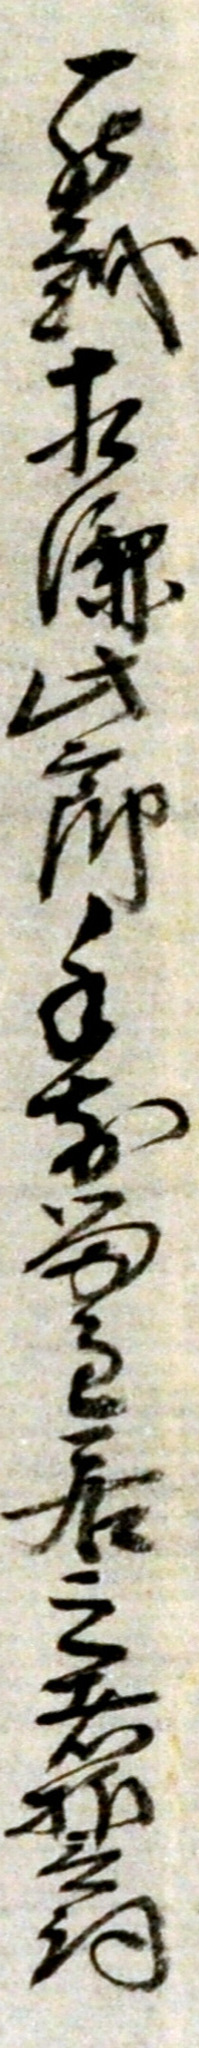罷越相済此節手前留守居之者誓詞
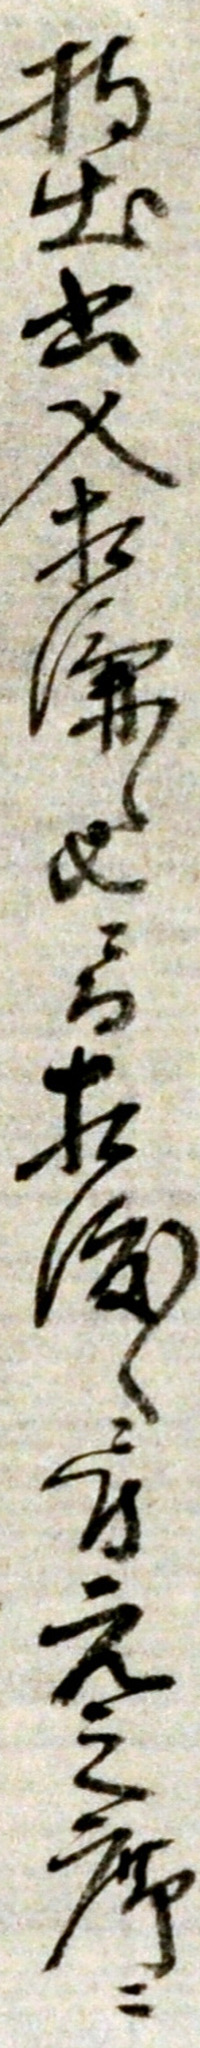持出出入相済候由ニ而相渡候二付元之席ニ
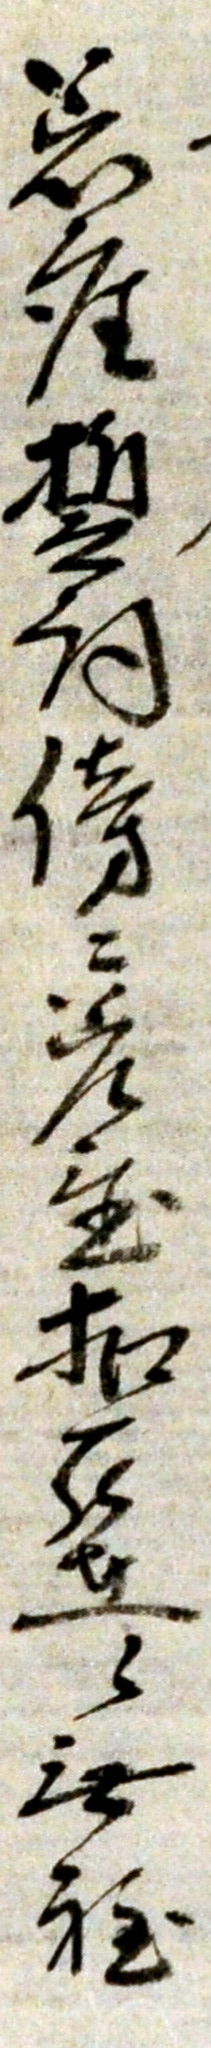着座誓詞傍ニ差置扣罷在候無程
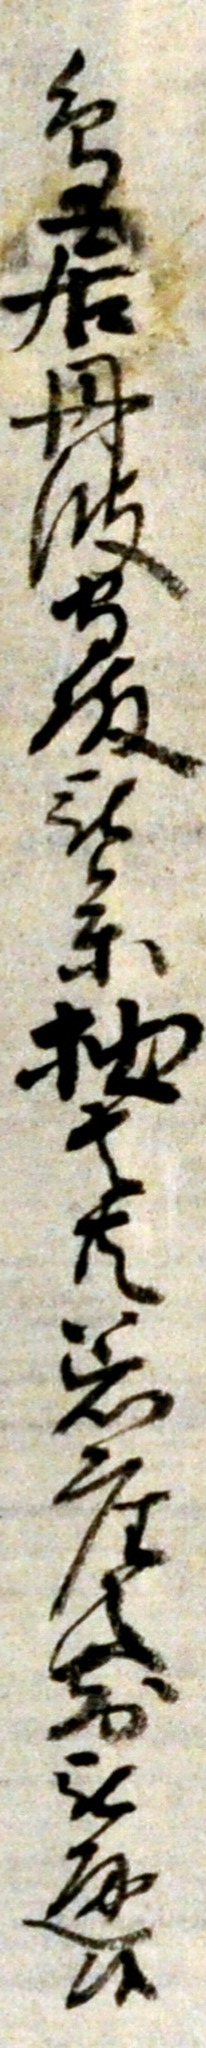鳥居丹波守殿被参拙者共着座之前被通候
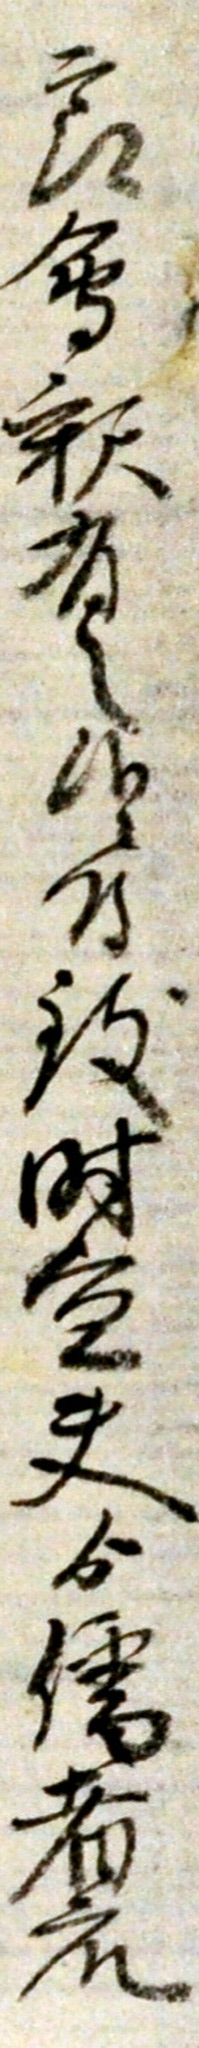節会釈有之候二付致時宜夫ゟ儒者衆
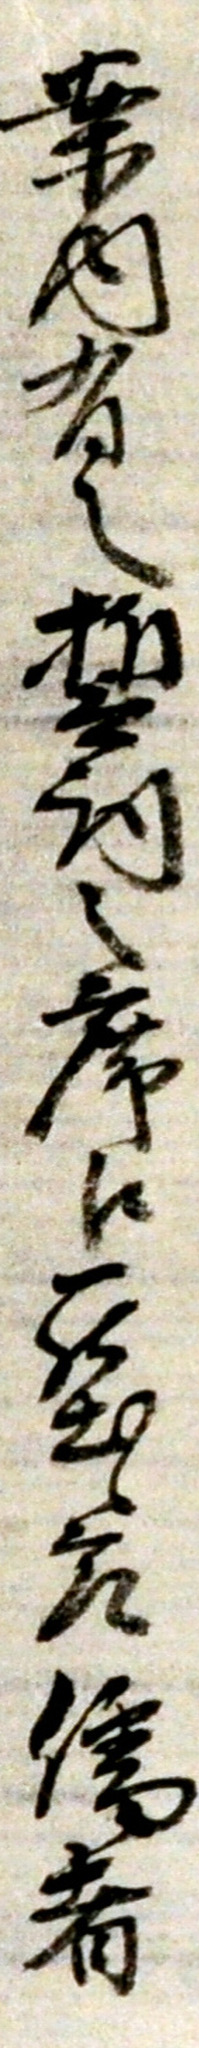案内有之誓詞之席江罷出候節儒者
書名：大阪加番関係諸書留〔一括〕
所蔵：伊那市立高遠町図書館・合同会社AMANE
